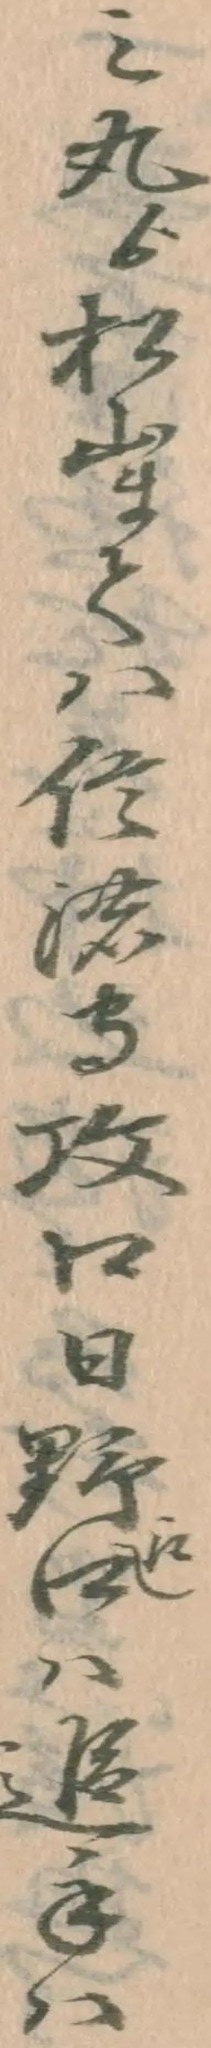之丸ゟ松山まては信濃守攻口日野江口は追手は
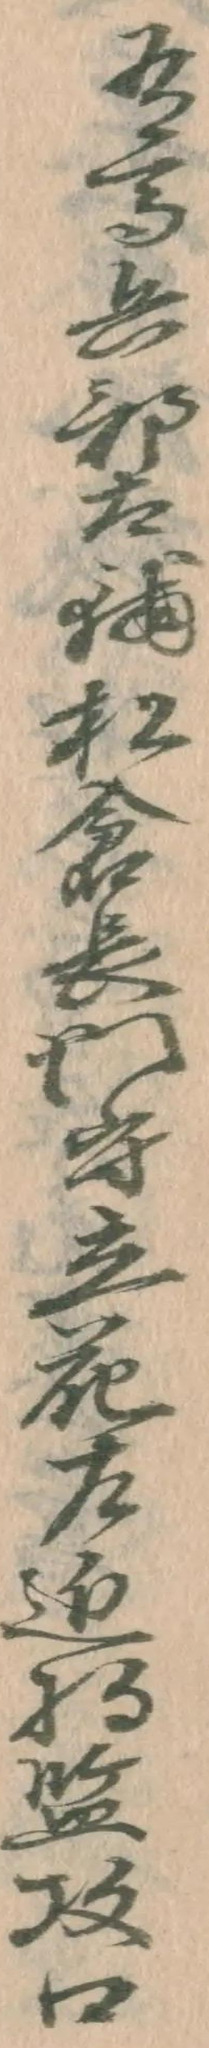有馬兵部太輔松倉長門守立花左近将監攻口
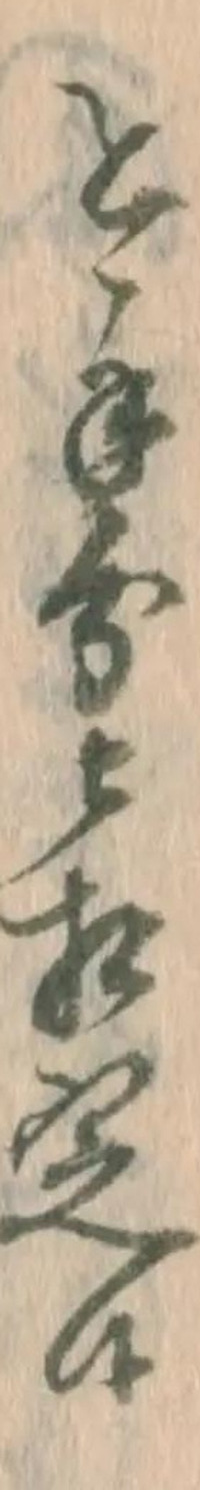と手分被相定候
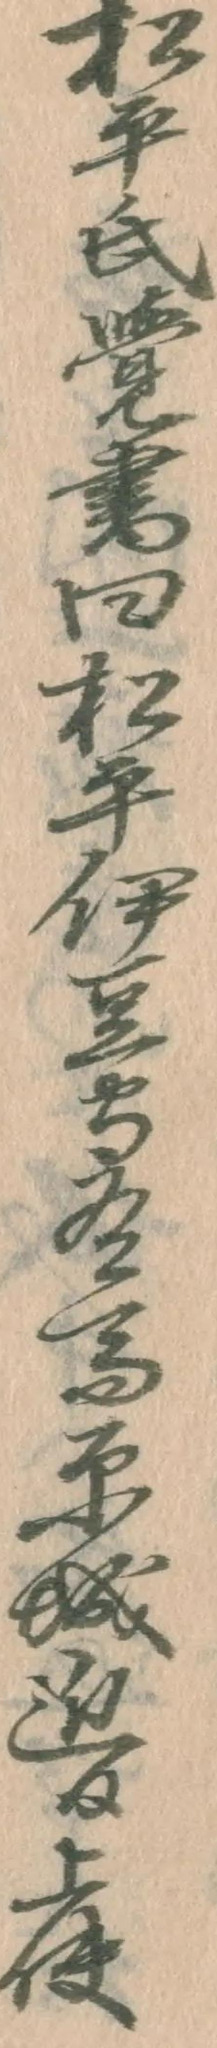松平氏覚書曰松平伊豆守有馬原城近日上使
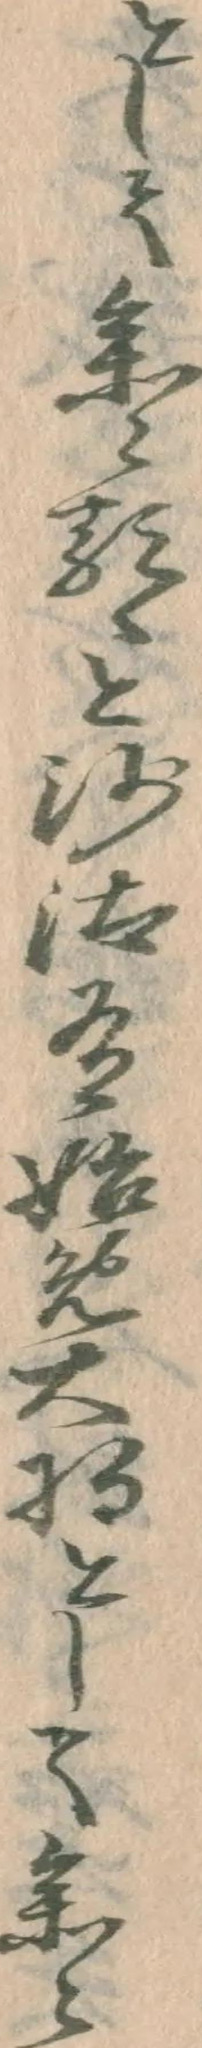として参に類々と沙汰有始免大将として参ら
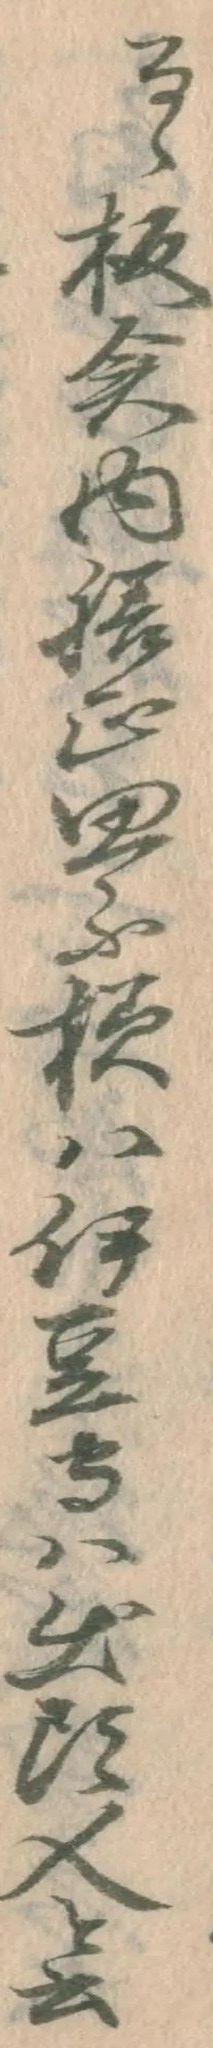るゝ板倉内膳正思ふ様は伊豆守は出頭人と云
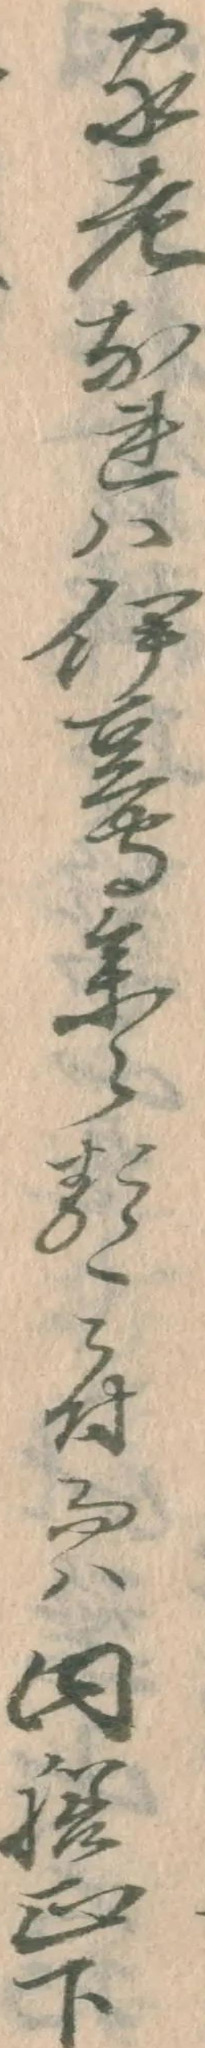家老な連は伊豆守参ら類々に付而は内膳正下
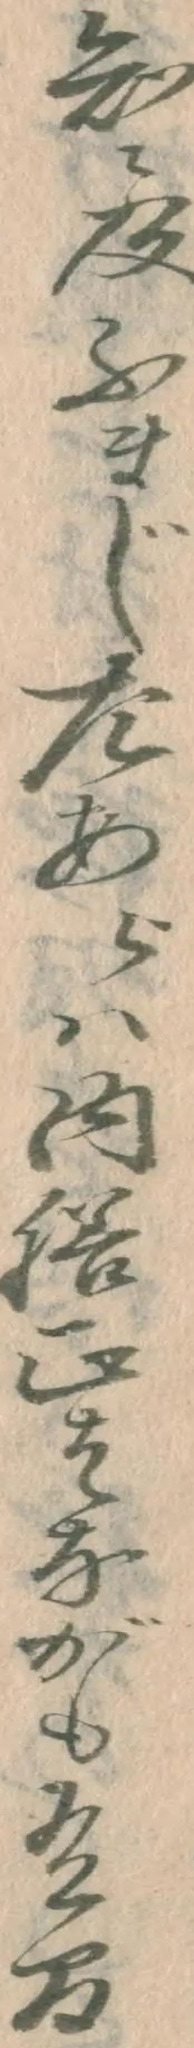知に及ふまじ左あらは内膳正者ながも有間
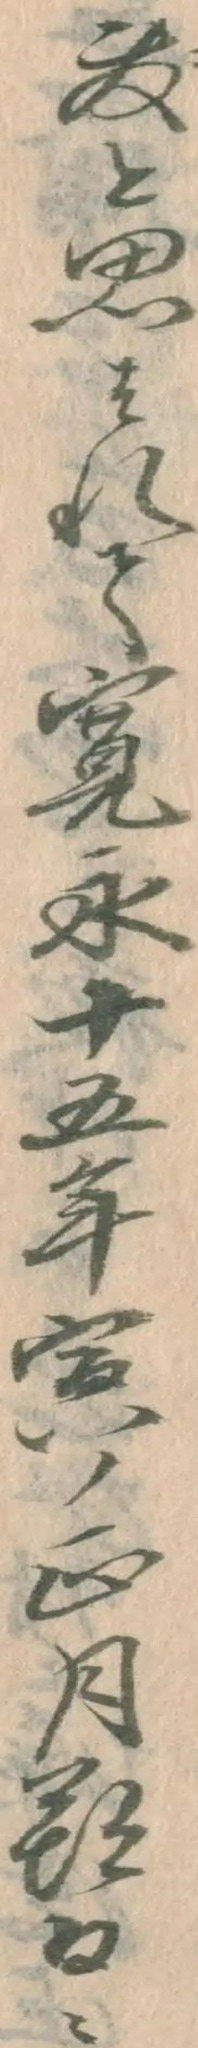敷と思者れて寛永十五年寅之正月朔日に
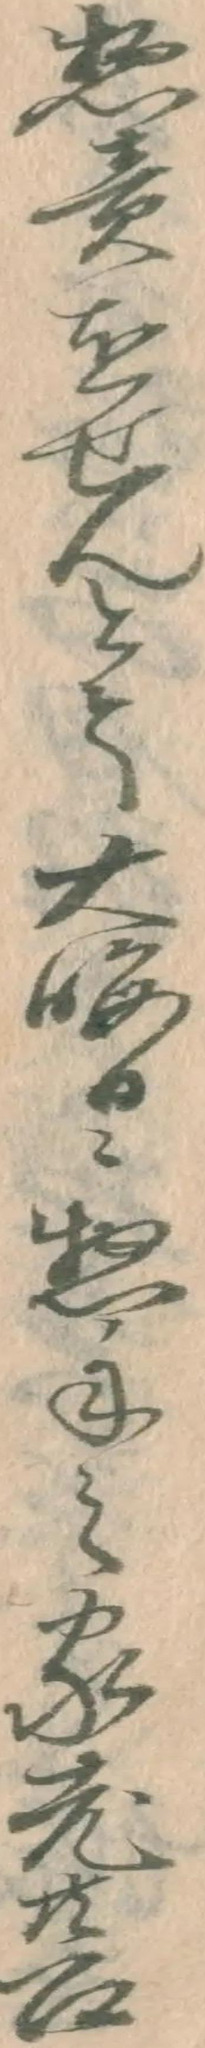惣責をせんとて大晦日に惣手之家老共召

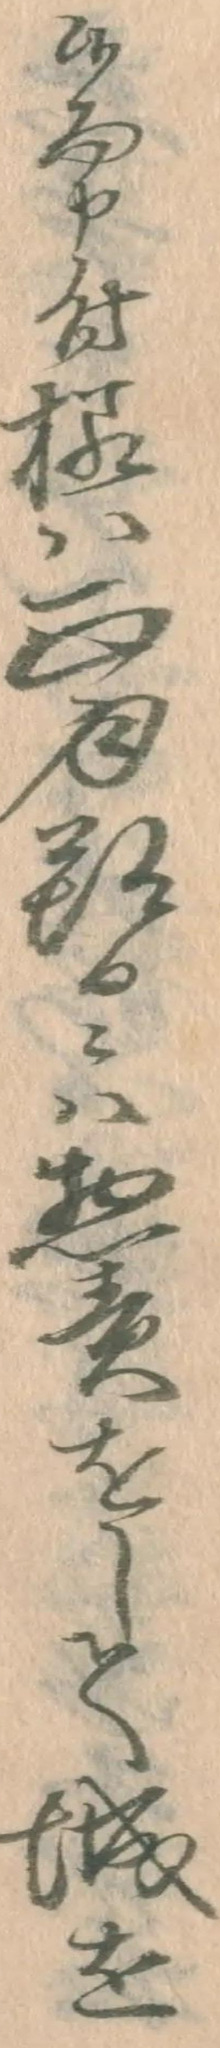候而申付様は正月朔日には惣責をして城を
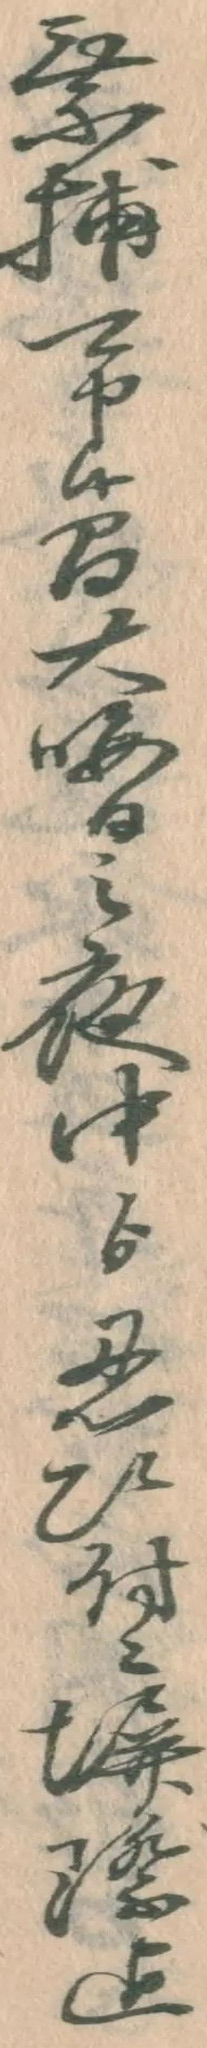乗捕可申候間大晦日之夜中ゟ忍ひ付に塀際迄
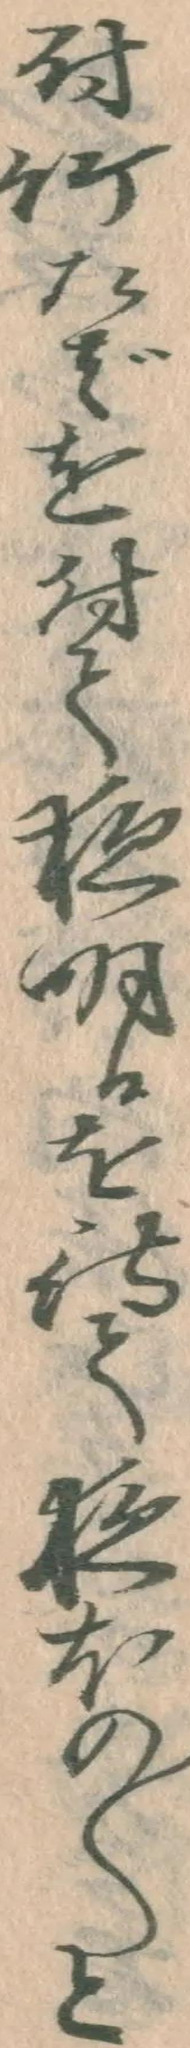付竹たばを付て夜明るを待て夜本の〳〵と
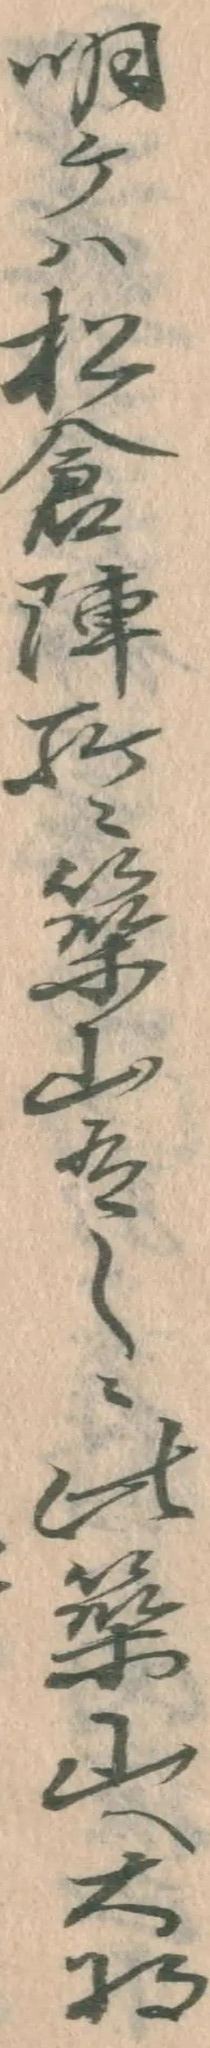明けは松倉陣所に築山有しに此築山へ大将
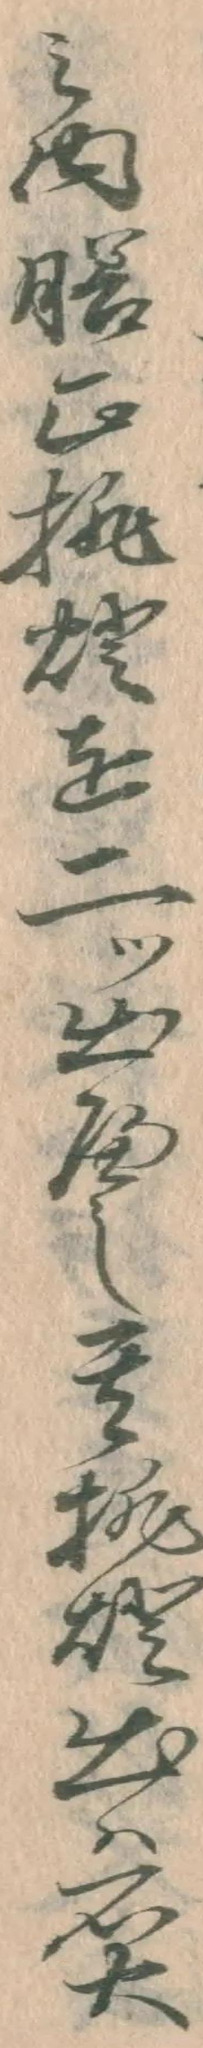之内膳正挑燈を二つ出扁し其挑燈出は石火
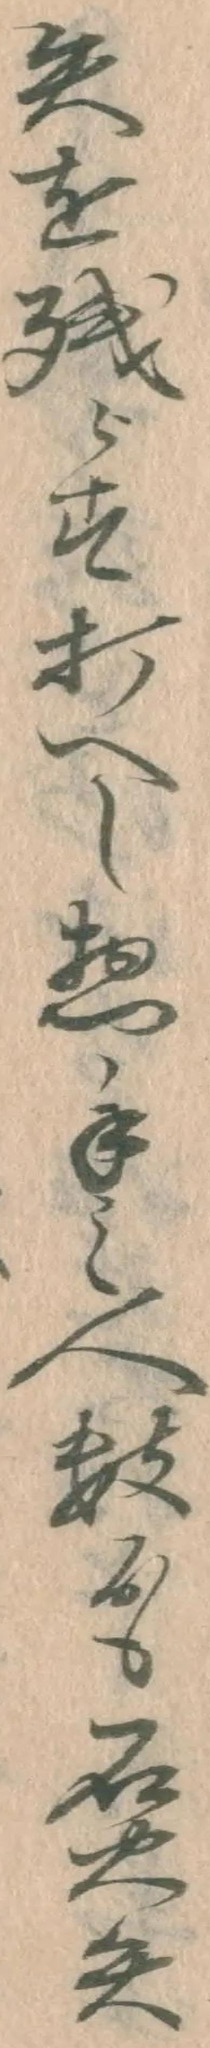矢を残ら春打へし惣手之人数ゟも石火矢
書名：切支丹御退治記 49巻. [5]
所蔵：国立国会図書館 National Diet Library, JAPAN
